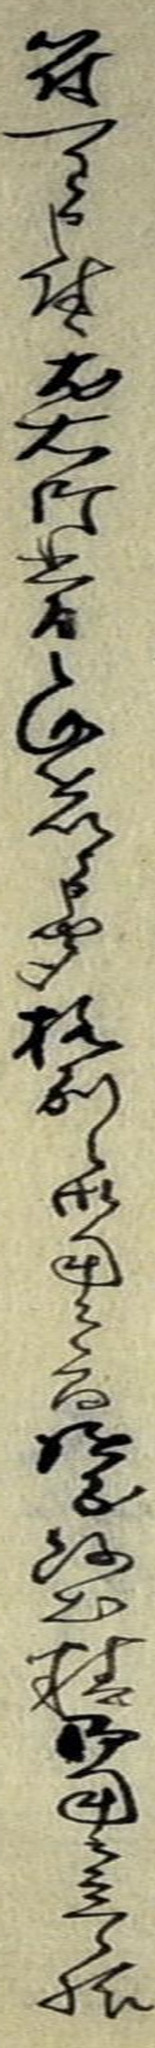符可被申付候尤右御書付之趣を以被申聞格別之御用に候間随分致出精御用に立候様
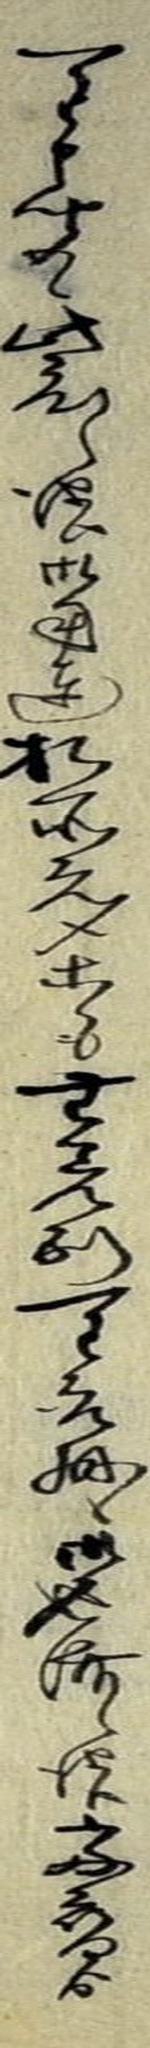可被申聞候此度之儀は御用達札所元〆等も無差別可被取扱候御返済之儀は当暮ゟ
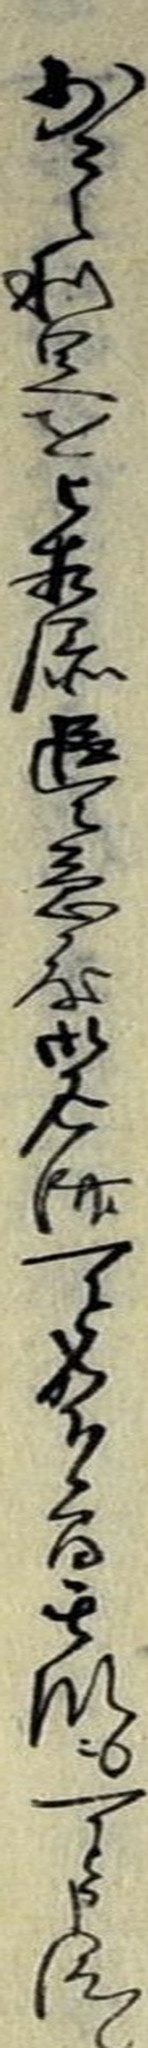少々之利足を被相添追々急度御返済可被成下候間其段も可被申渡候
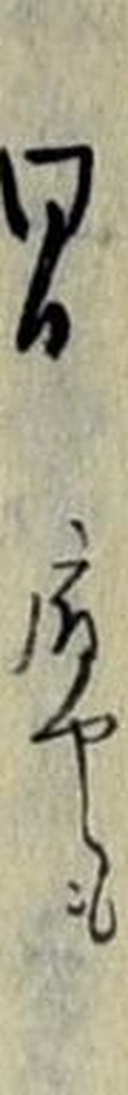同日府中へも
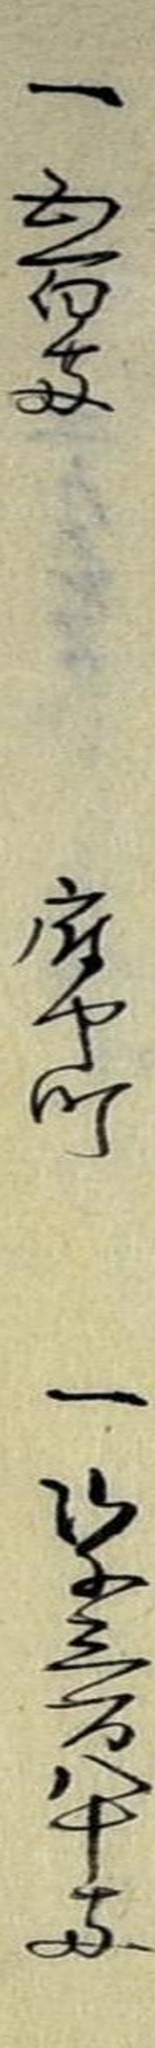一五百両府中町一弐千三百八十両上領
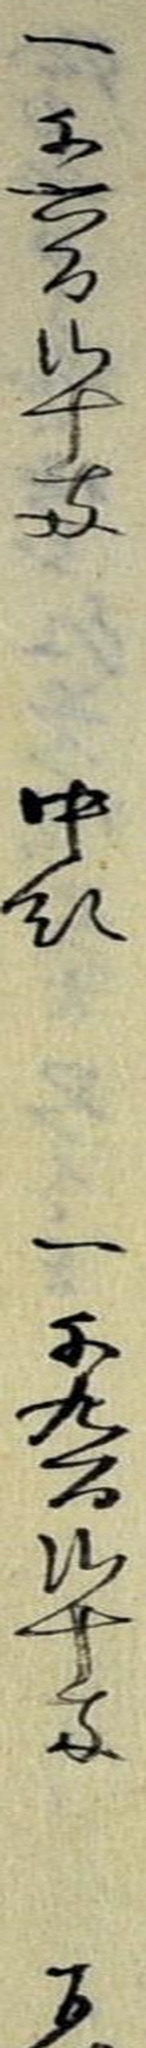一千六百弐十両中領一千九百弐十両下領
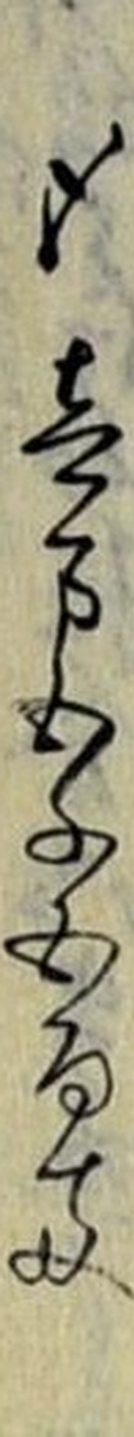〆壱万五千五百両
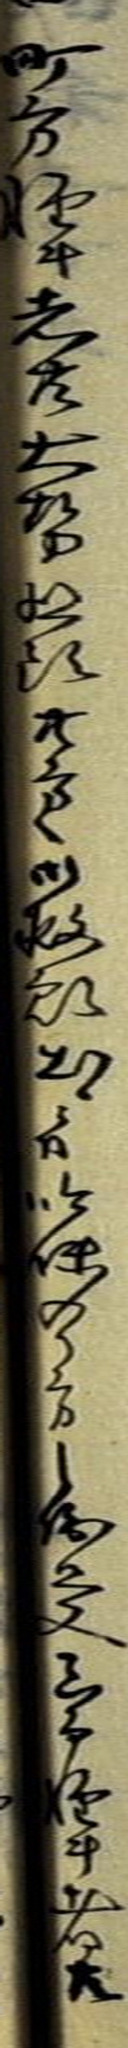〇町方軽き者共大勢組頭共方へ御救願出候に付吟味〆り方之儀且又至而軽き者共
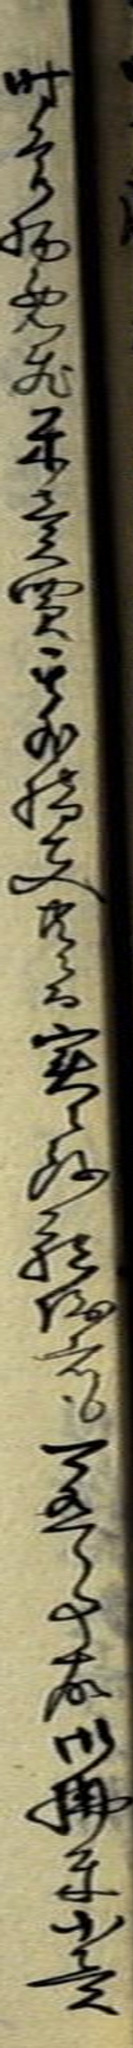時節柄悪敷米売買其外指支共に而実に致難儀者も可有之事故御払米小売
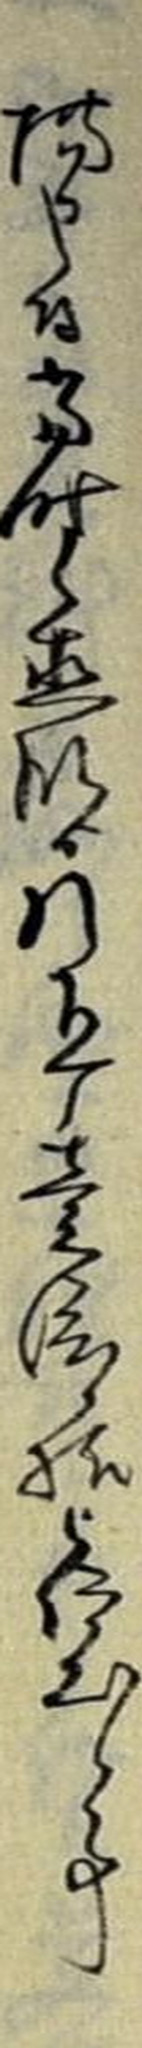場申付当時之直段ゟ引下ケ売渡候様被仰出候事
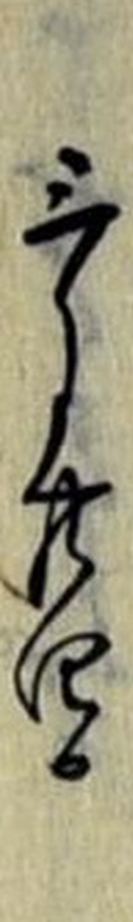三月廿四日
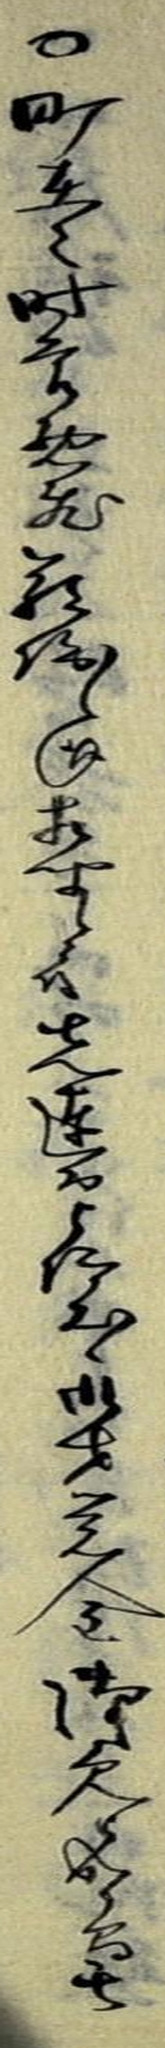〇町在々時節悪敷難儀之趣相聞候に付先達而被仰出候御才覚金御免被成候間其
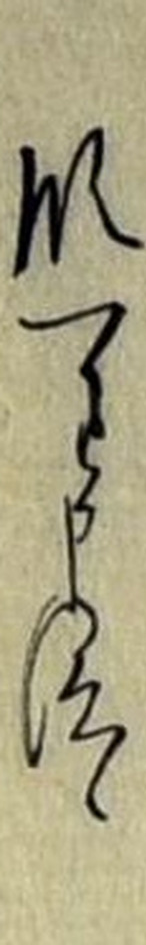段可被申渡候
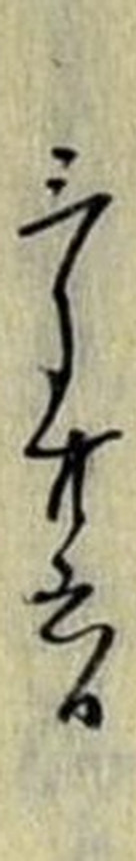三月廿六日
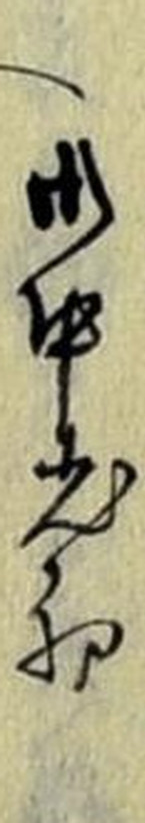御中老初
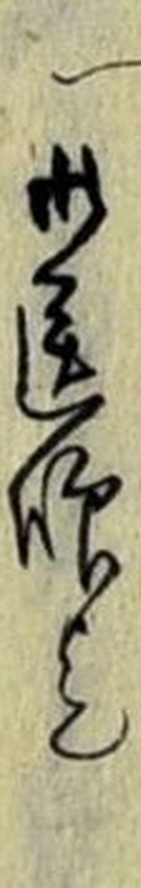御医師迄
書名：命令之部 二
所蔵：福井県文書館 Fukui Prefectural Archives
